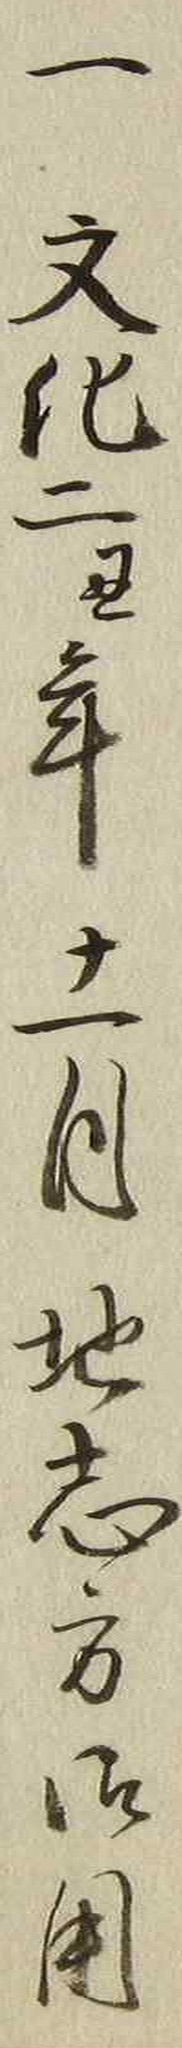一文化二丑年十一月地志方御用
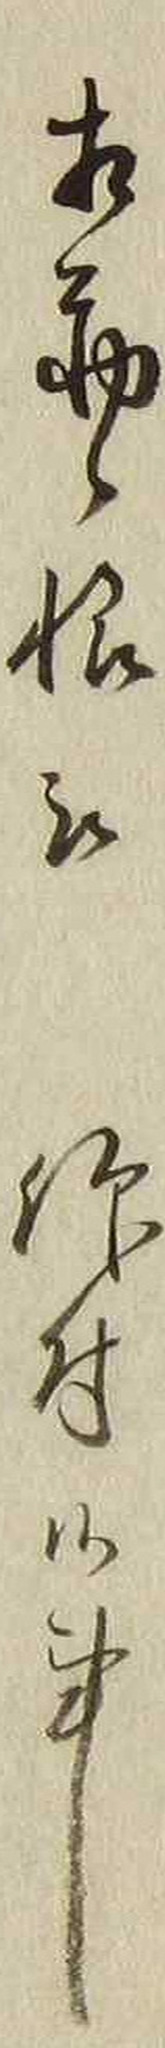相勤候様被仰付候事
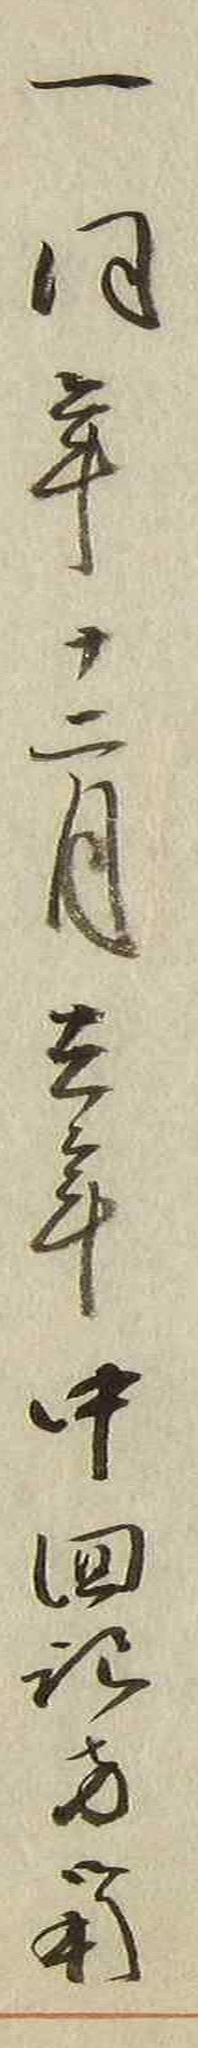一同年十二月去年中回記方御用
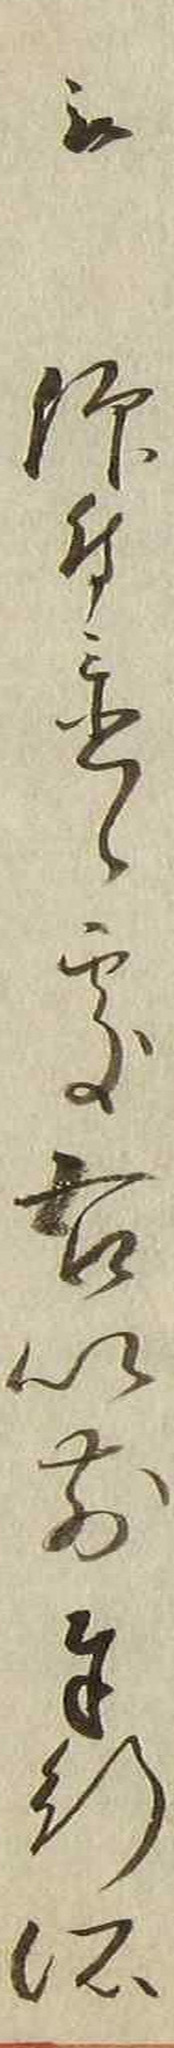被仰付置候処右以前奉行所
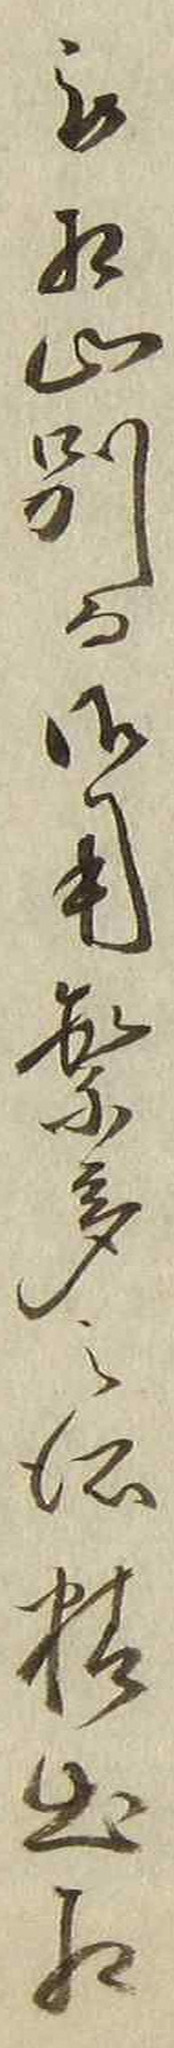被相止別而御用繁多之所精出相

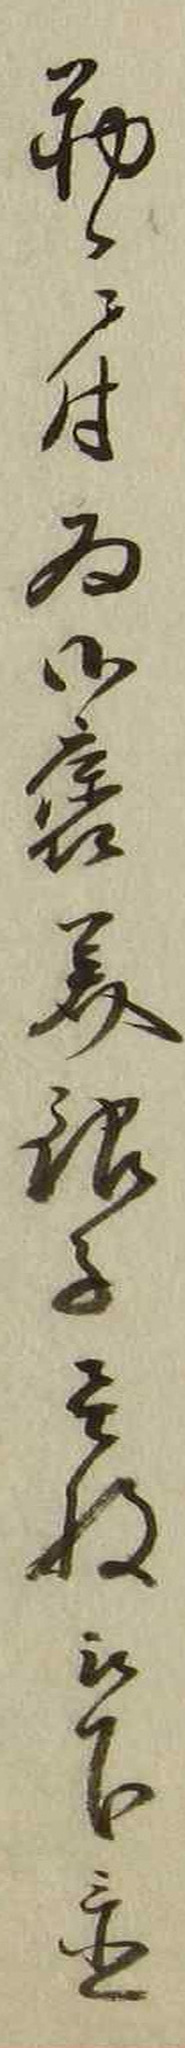勤候ニ付為御褒美銀子壱枚被下置
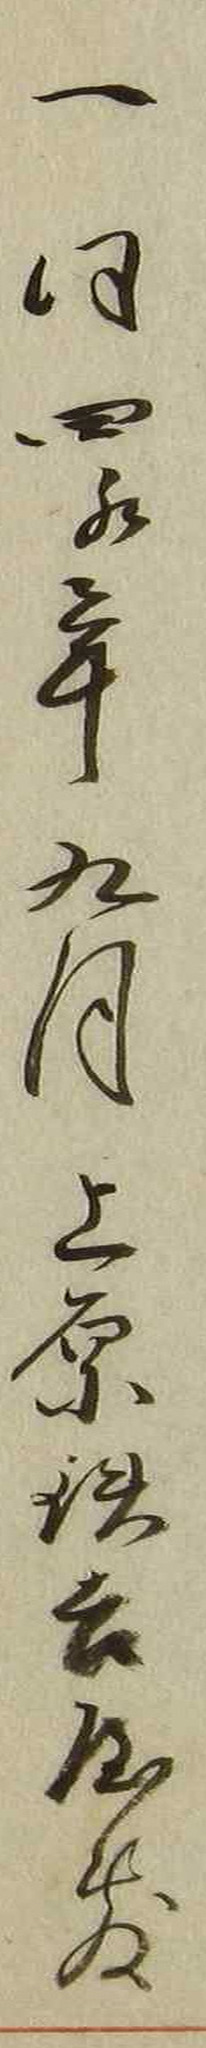一同四卯年九月上原鉄吉屋敷
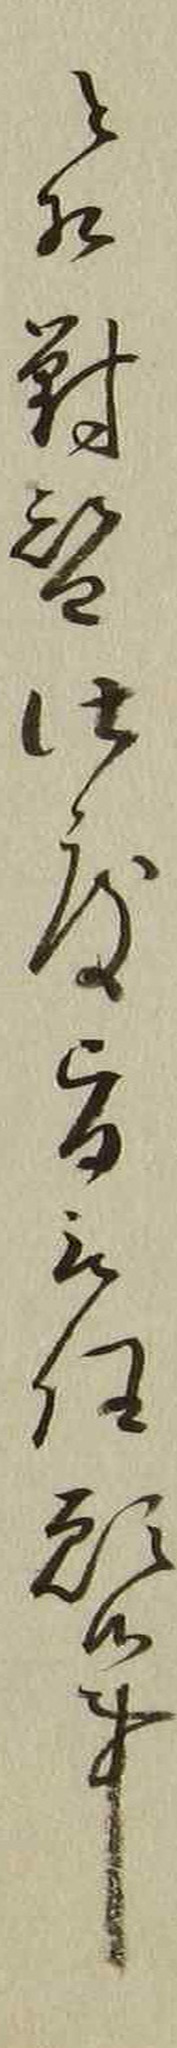と相対替仕度旨被任願候事
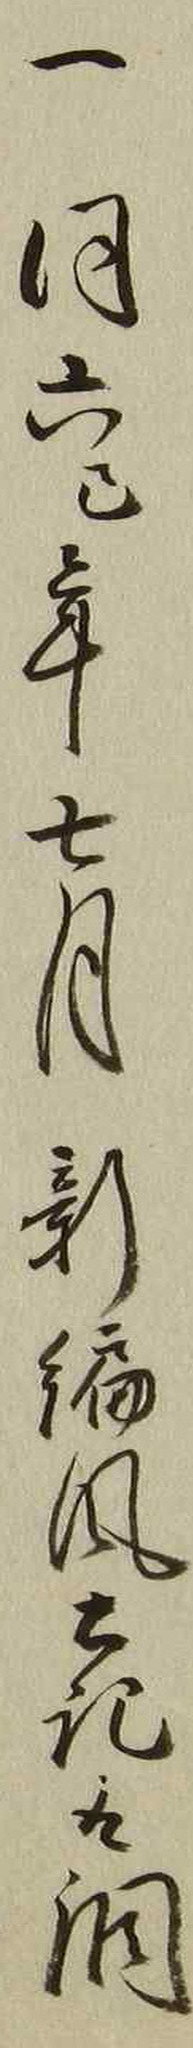一同六巳年七月新編風土記取調
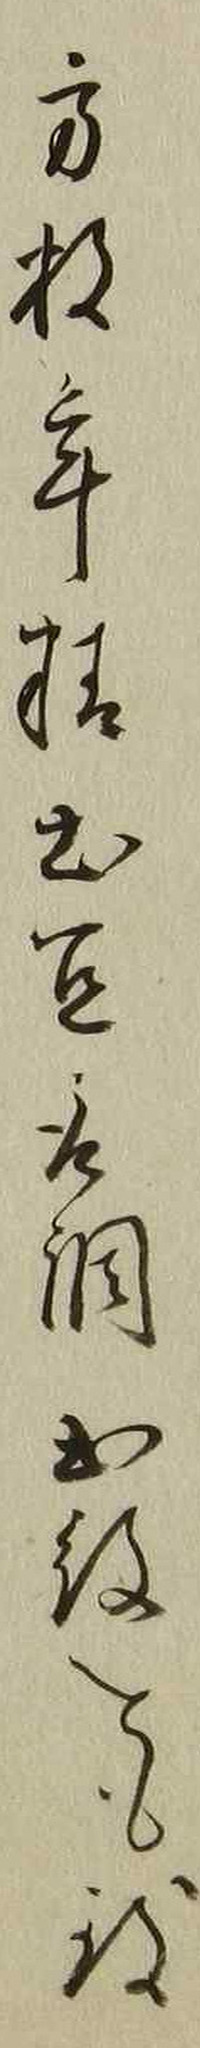方数年精出宜取調出役をも致
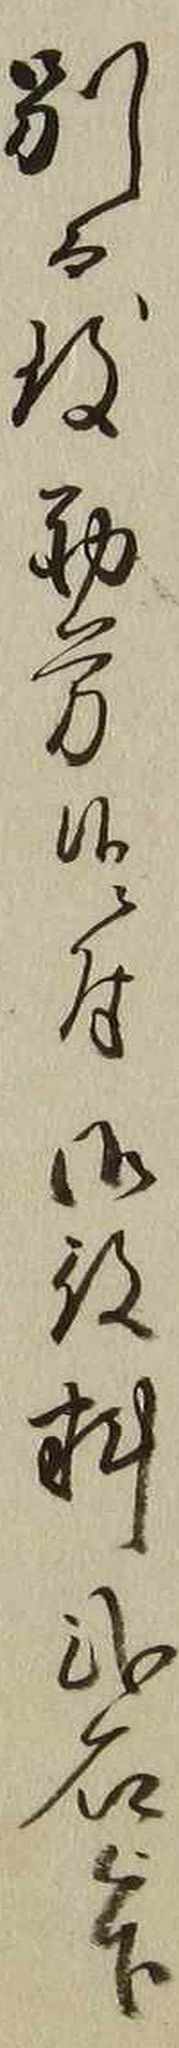別而致勤労候ニ付御役料弐石被下
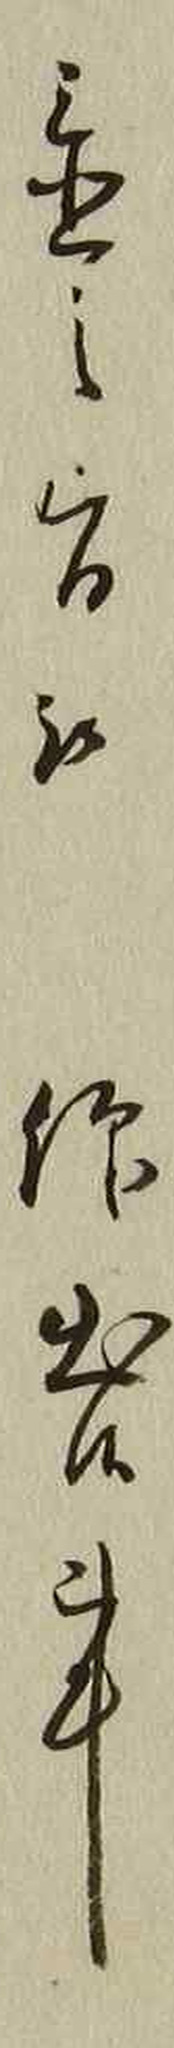置之旨被仰出候事
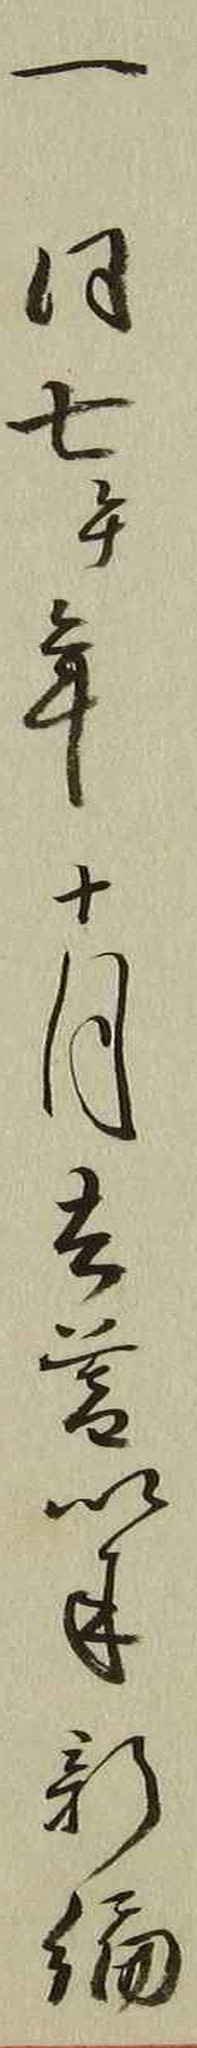一同七午年十月去暮以来新編
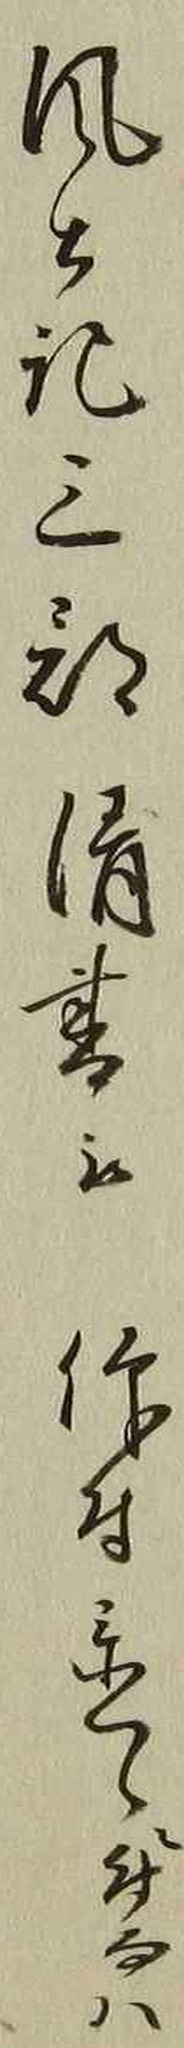風土記三部清書被仰付置候ニ付而は
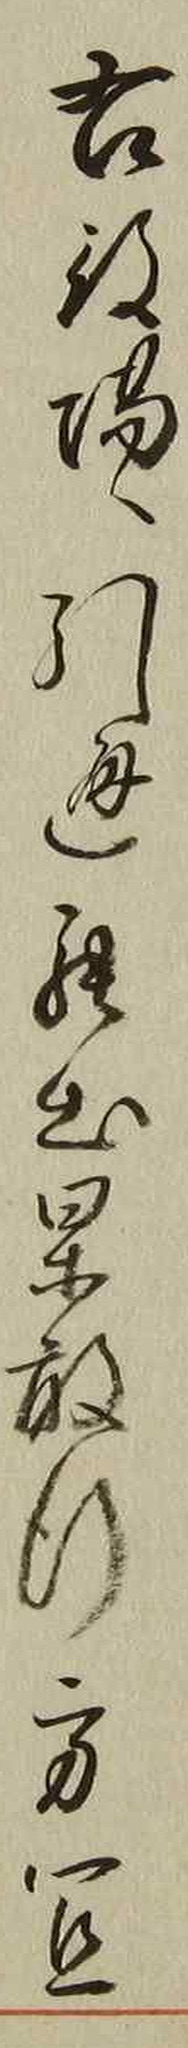右役場へ引通罷出果敢行方宜
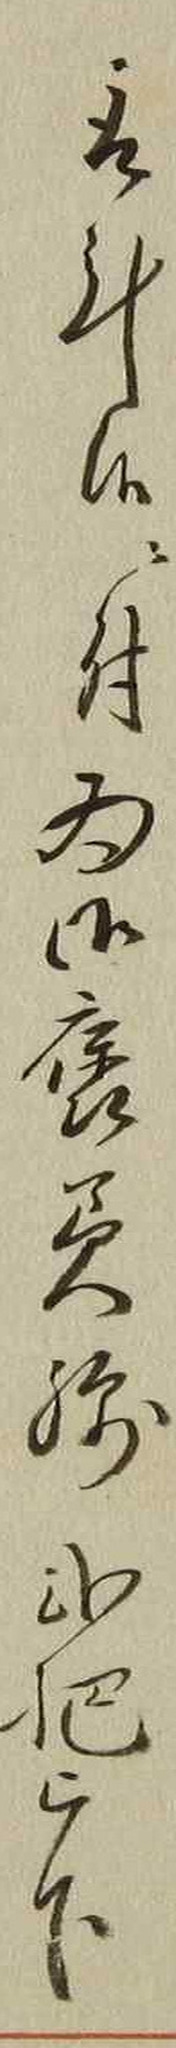取計候ニ付為御褒美綿弐把被下
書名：諸士系譜　巻之32　い之部32
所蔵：会津若松市立会津図書館
